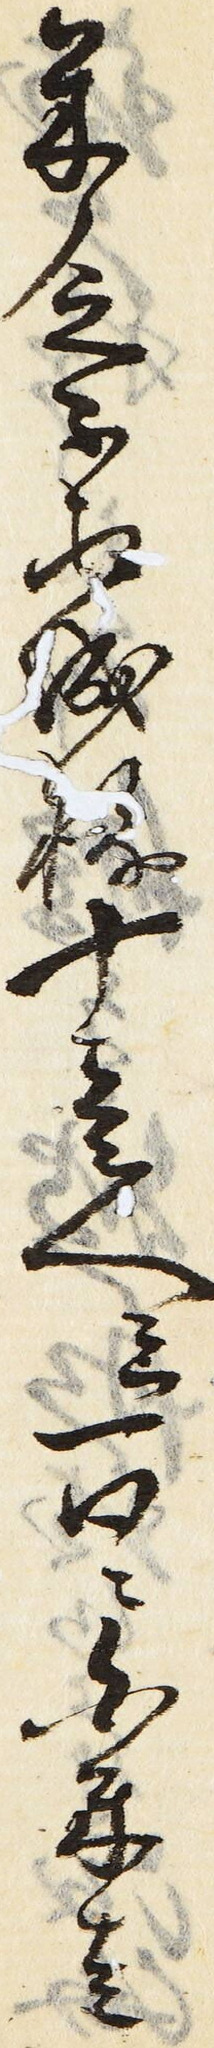米乏不相成様十壱人ニ而一日ニ白米壱
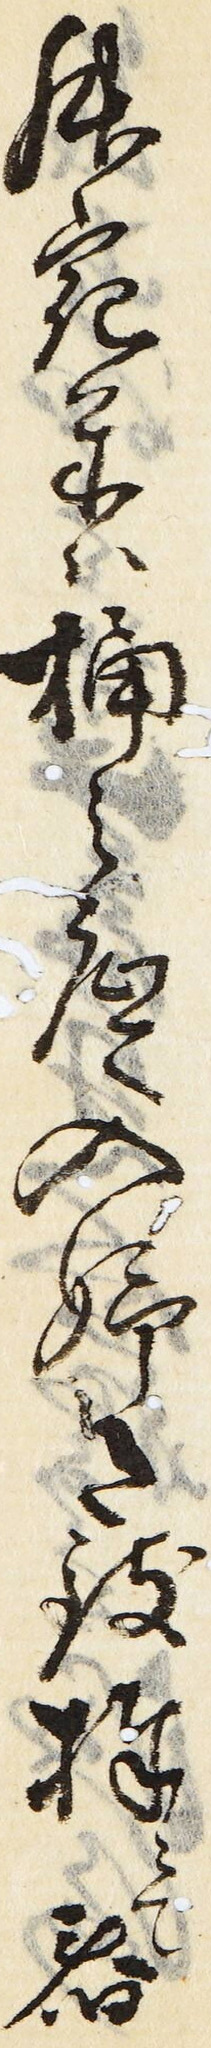升宛米ハ桶之底へ入ふた致棒ニて舂
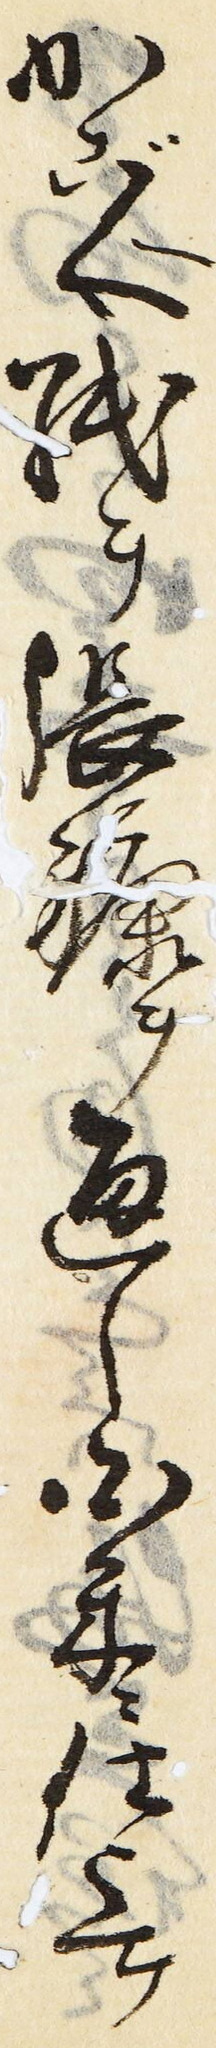かごへ紙ヲ張糠ヲ通し白米ニ仕上ケ
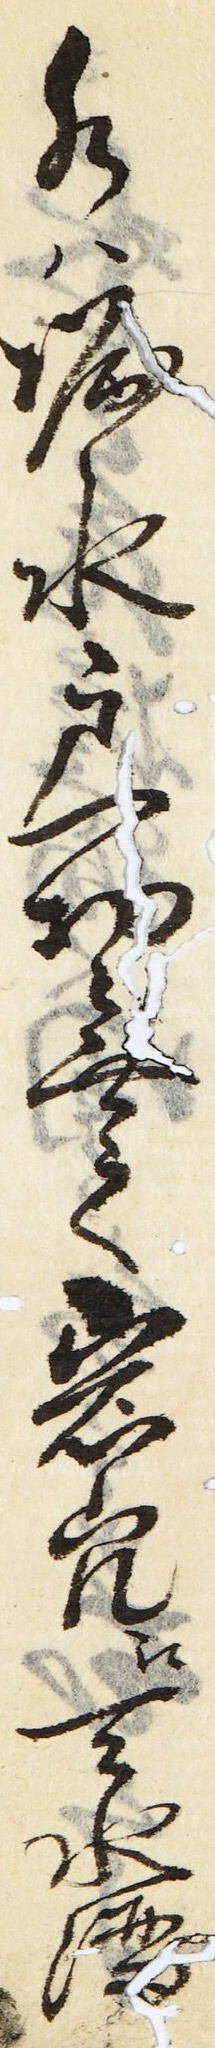水ハ堀水戸一切無之岩穴え天水溜
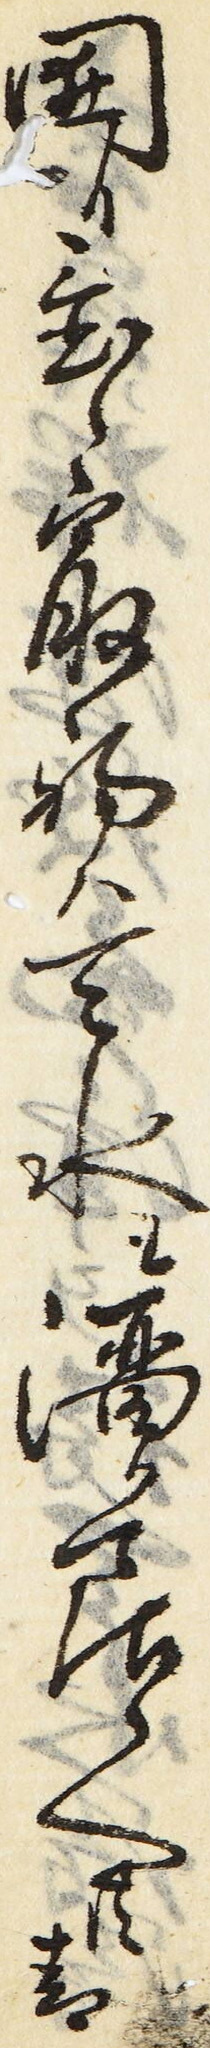囲イ置候最初ハ天水も溜り居候へ共青
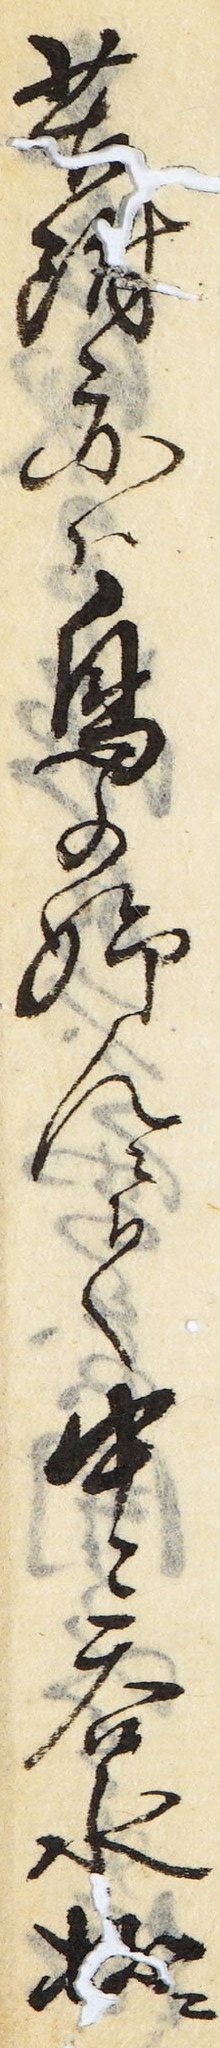苔付亦ハ鳥のふんニて中々呑水抔ニ

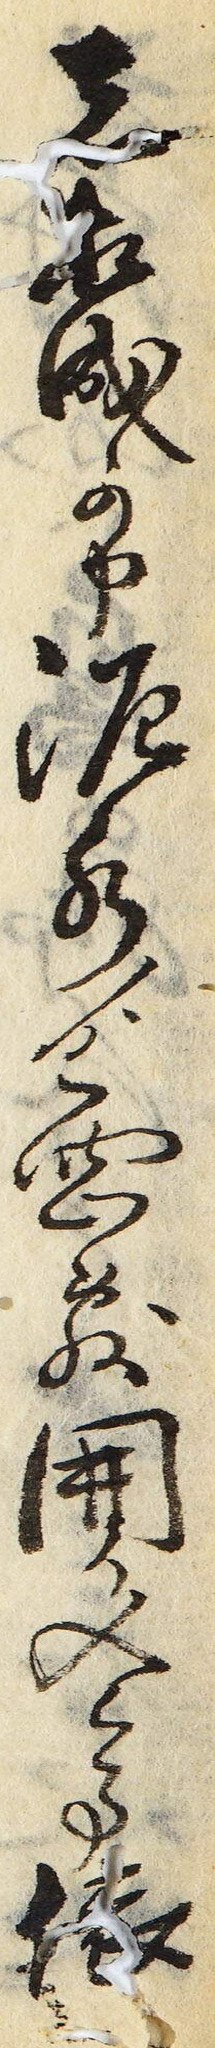は相成不申泥水ゟ悪敷囲イ〆候事仮
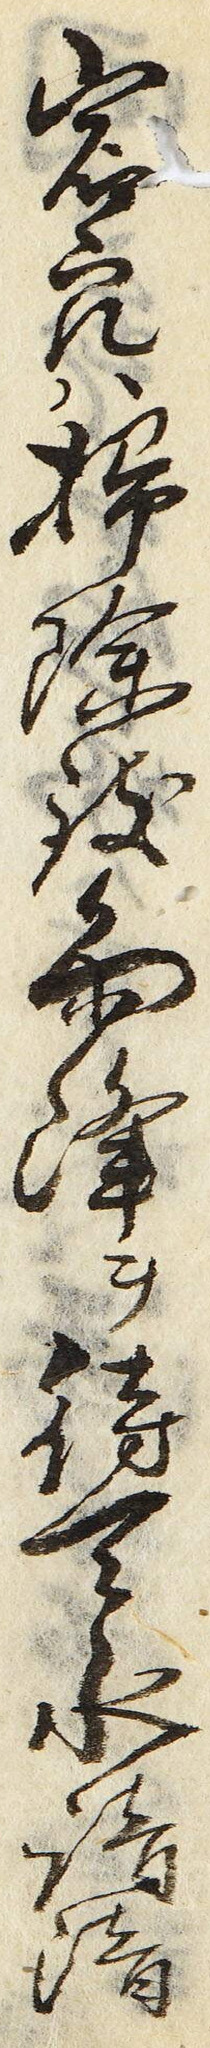岩穴ハ掃除致雨降ヲ待天水請清
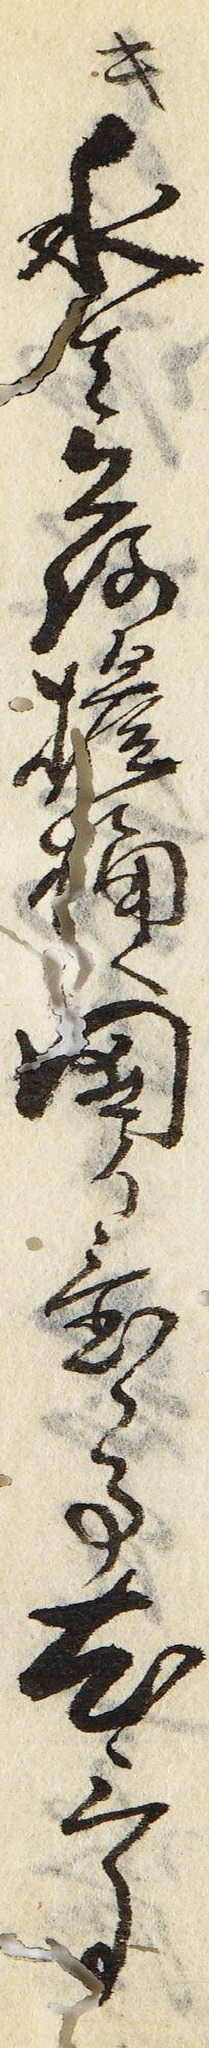キ水は荷担桶へ囲イ置候事尤三月
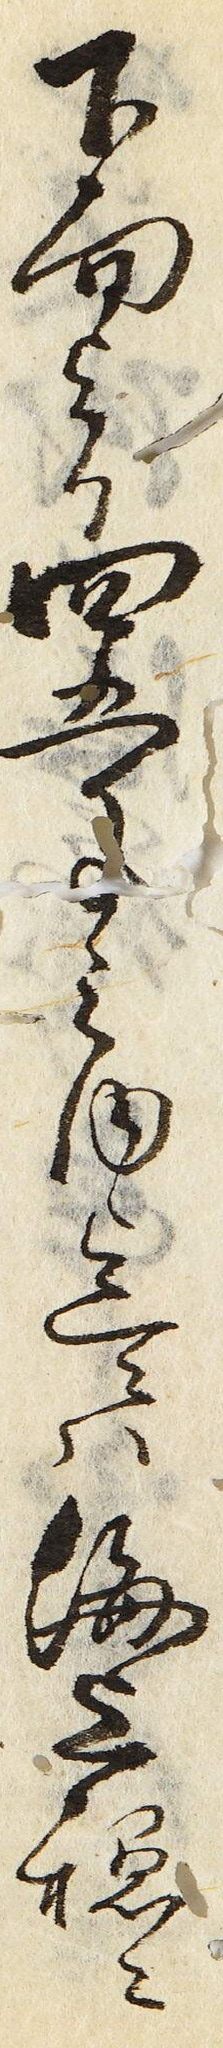下旬より四五月之内迄ニハ海上穏ニ
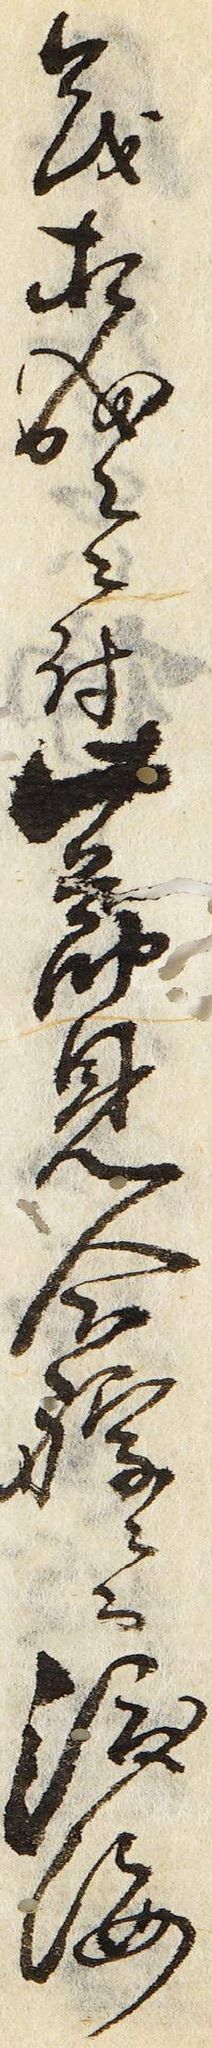も相成候ニ付此節見合艀ニ而渡海
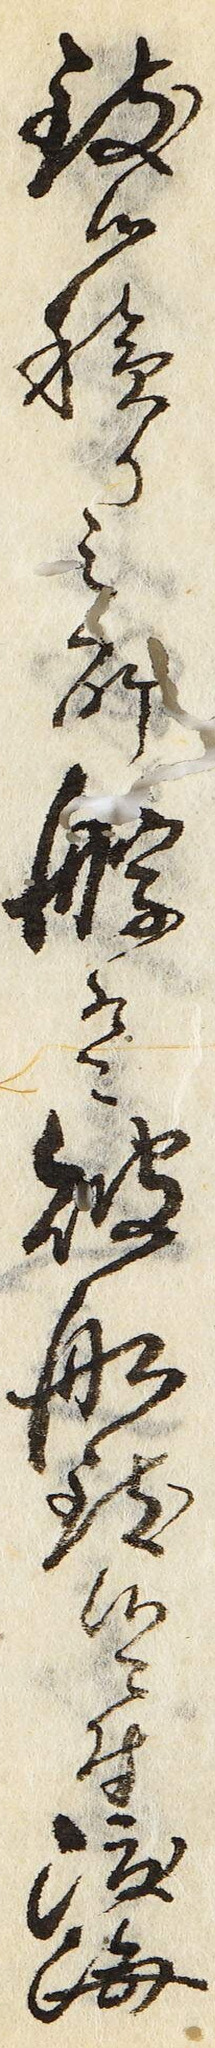致候積り之所艀は破船致候ニ付渡海
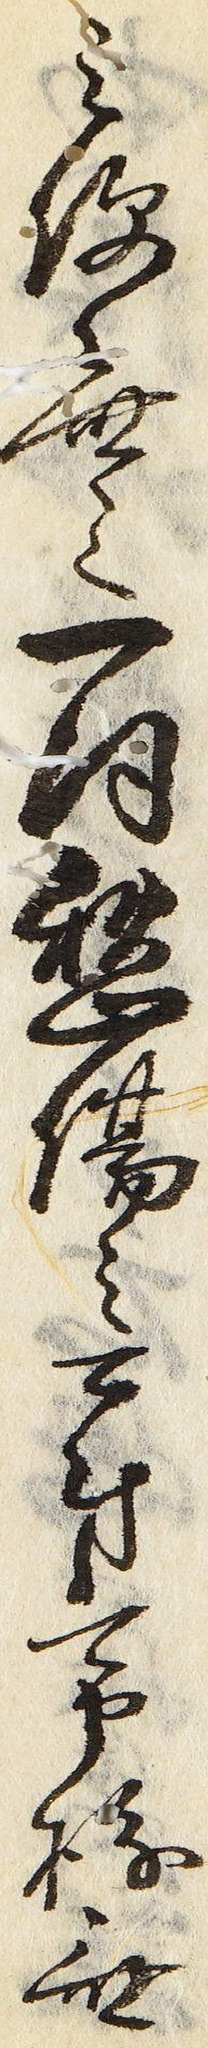之便無之一同愁傷之乙第？可申様無
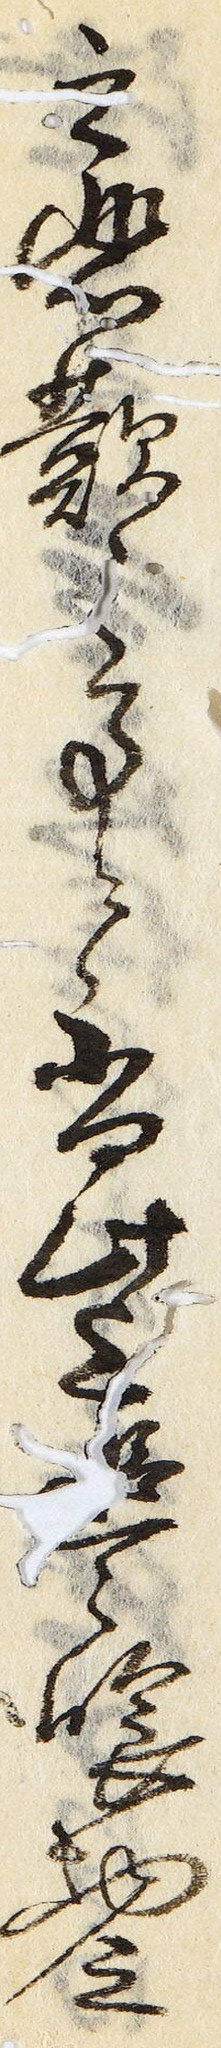之悲歎之事ニ候尚此上追々喰物之
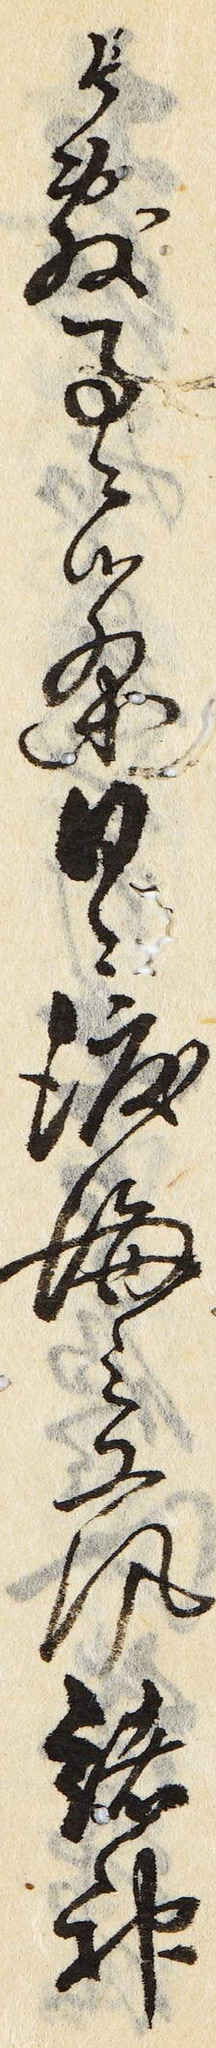ケ敷事ニ候条日々渡海之工風緒神
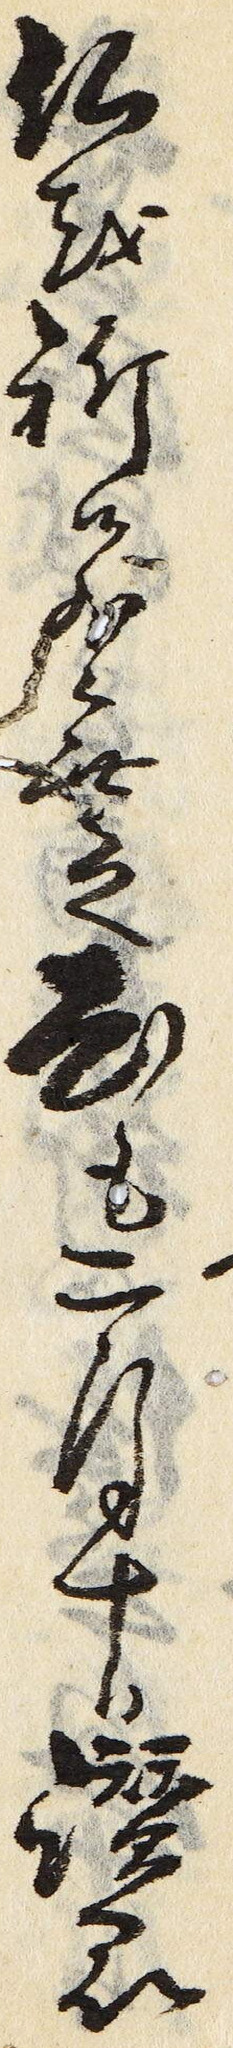仏を祈候外無之尤も二月十日讃州
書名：阿波幸宝丸漂流記
